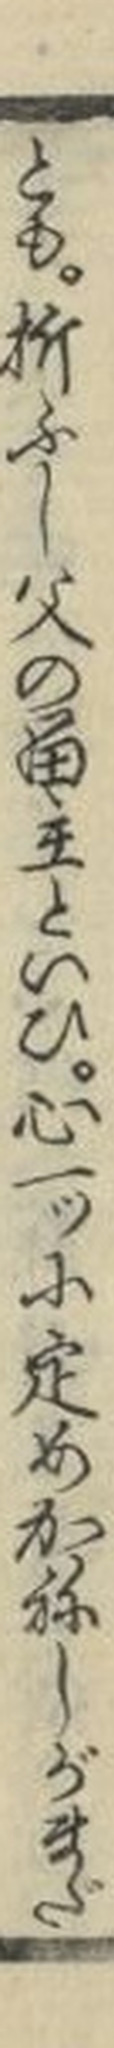とも。折ふし父の留主といひ。心一ッに定めかねしがまだ
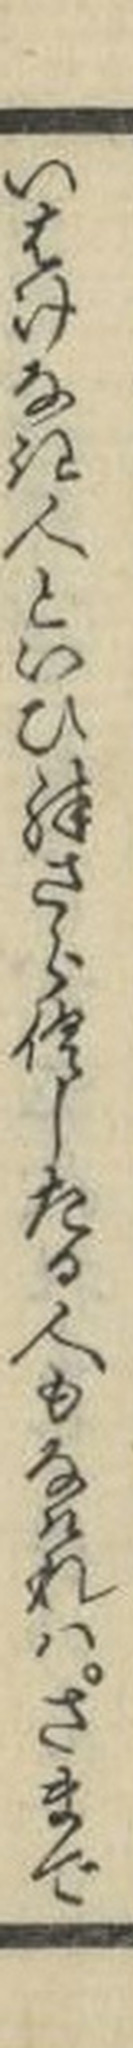いはけなき人といひ殊さら倶したる人もなけれは。さまで
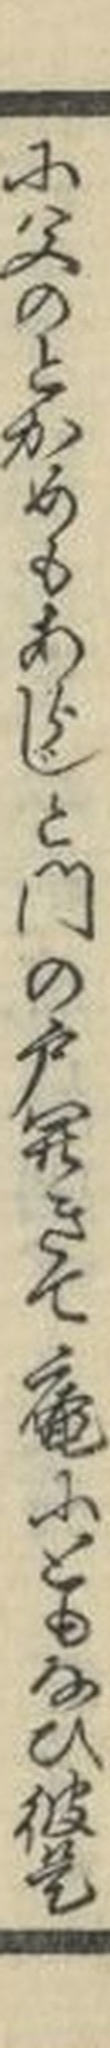に父のとかめもあらじと門の戸を開きて庵にともなひ彼是
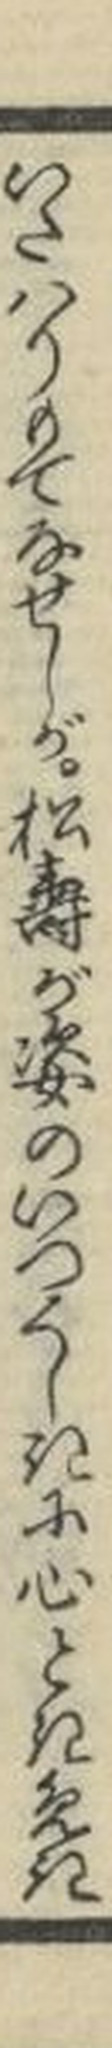いたはりもてなせしが。松寿が姿のいつくしきに心ときめき
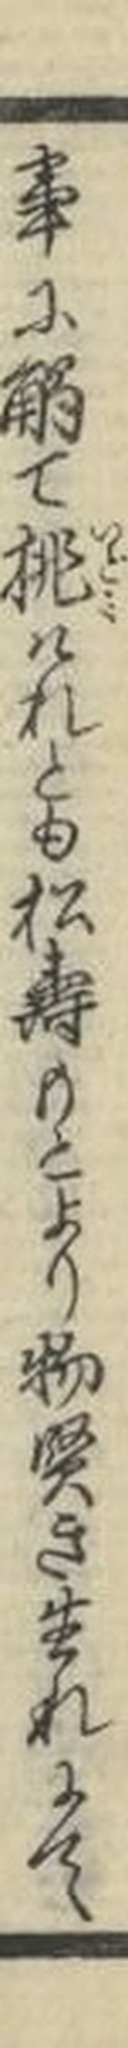事に触て挑けれとも松寿もとより物賢き生れにて
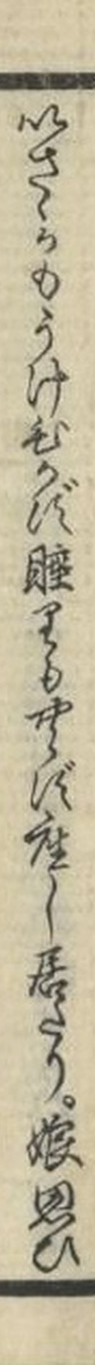いさゝかもうけひかず睡りもやらず座し居たり。娘思ひ
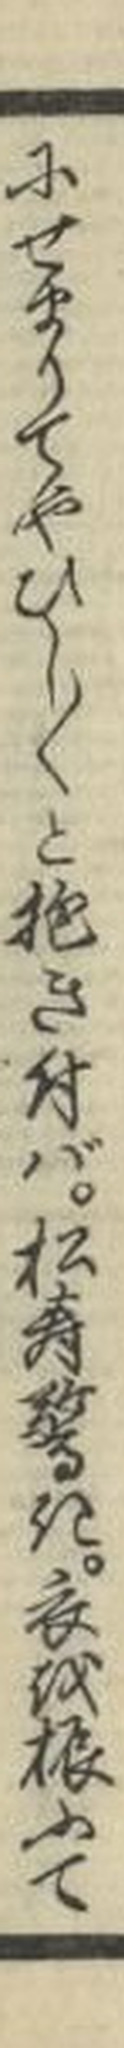にせまりてやひし〳〵と抱き付ば。松寿驚き。衣を振ふて
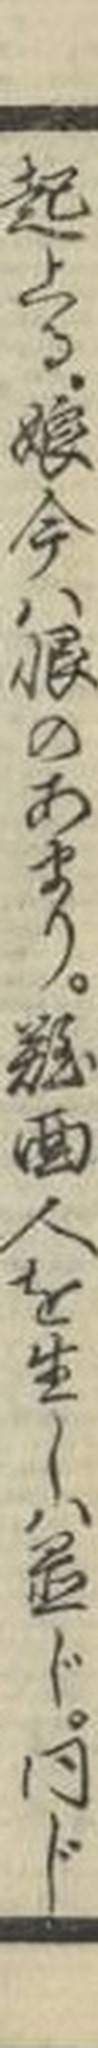起上る。娘今は恨のあまり。難面人を生しは置じ。同じ
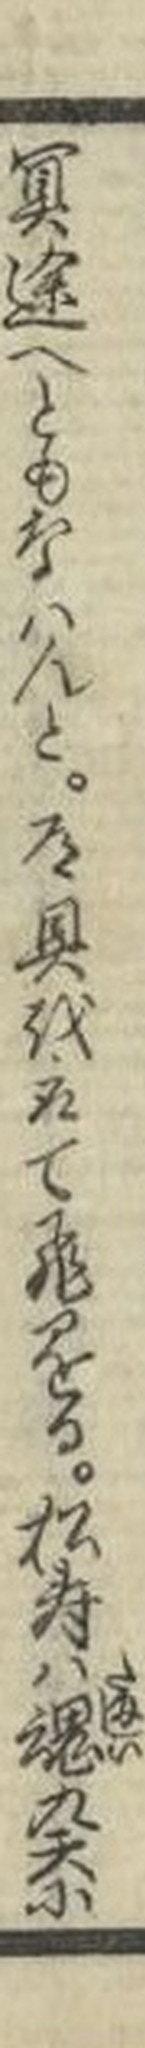冥途へともなはんと。道具を取て飛懸る。松寿は魂九天に
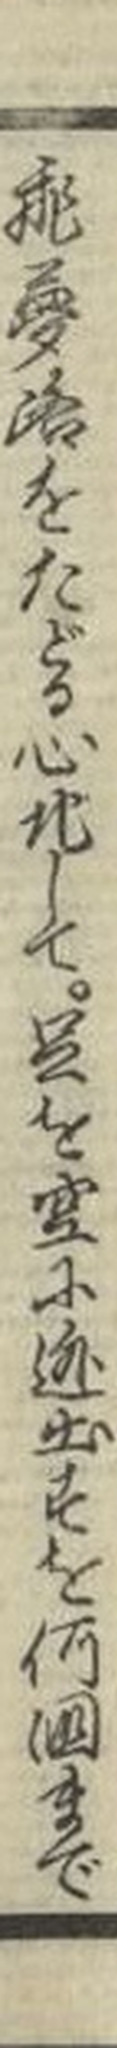飛夢路をたどる心地して。足を空に逃出すを何国まで
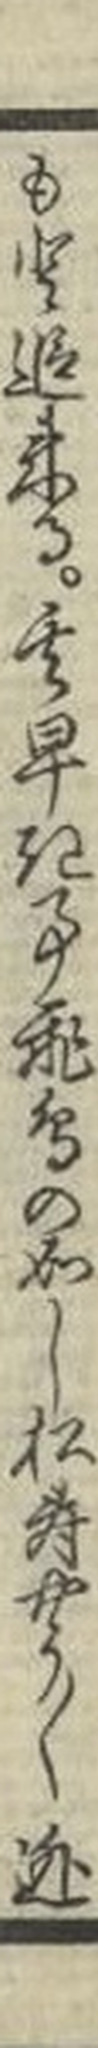もと追来る。其早き事飛鳥の如し松寿やう〳〵逃
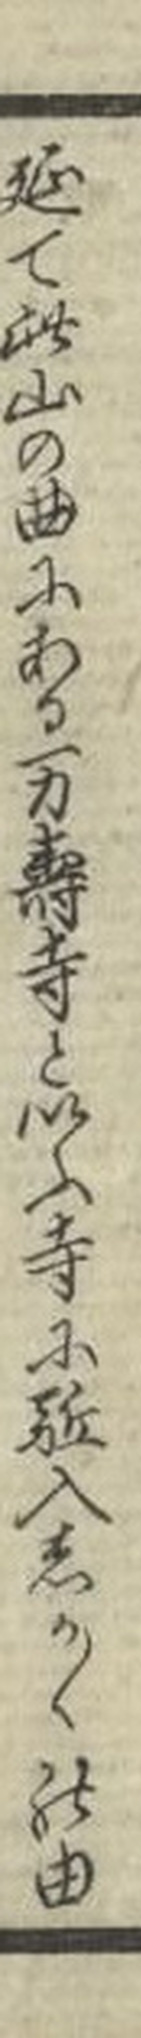延て此山の曲にある万寿寺といふ寺に駈入しか〳〵の由
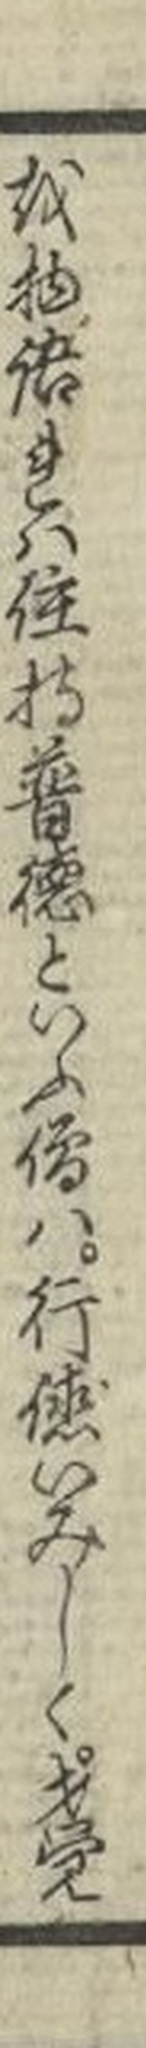を物語れは住持普徳といふ僧は。行徳いみしく。才覚
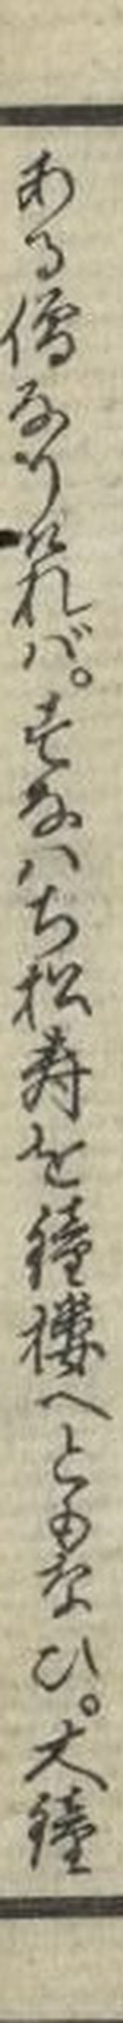ある僧なりければ。すなはち松寿を鐘楼へともなひ。大鐘
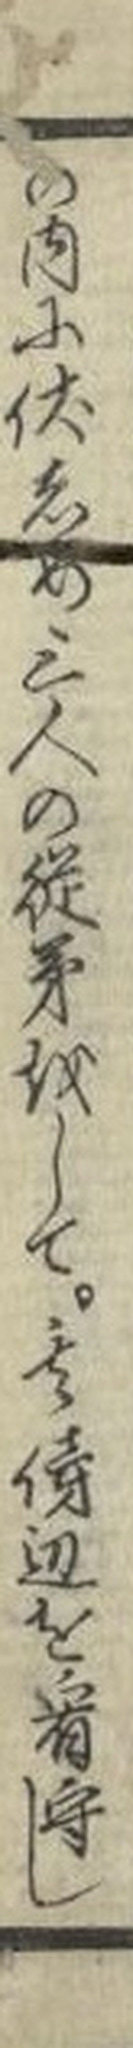の内に伏しめ三人の従弟をして。其傍辺を看守し

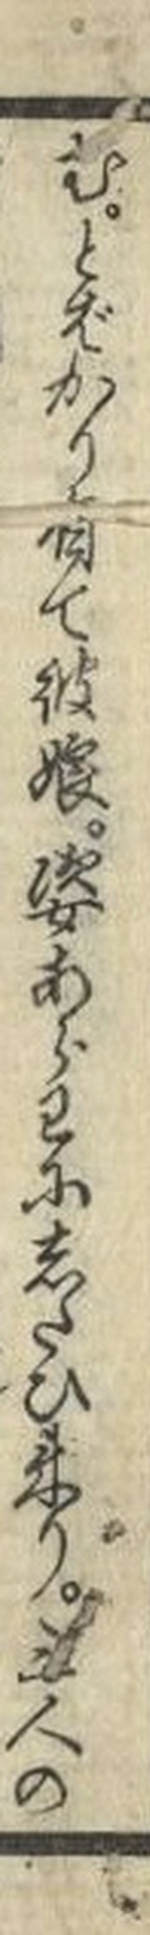む。とばかり有て彼娘。姿あらわにしたひ来り。三人の
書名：琉球解語
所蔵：University of the Ryukyus Library
